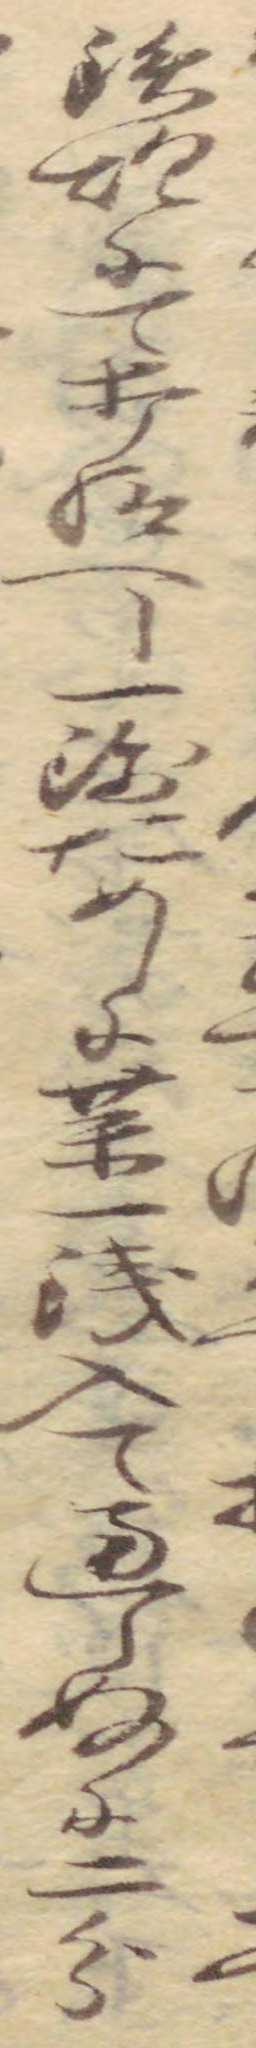鉄砲にて打給へし一銭ためしに薬一銭入て通らぬに二分
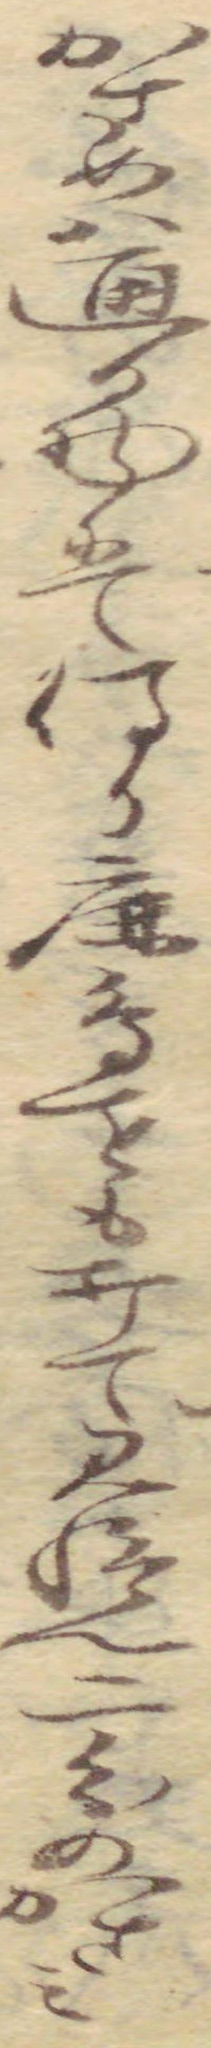かさめは通る物にて侍り鹿鳥をも打て見給へ二分のかさみ
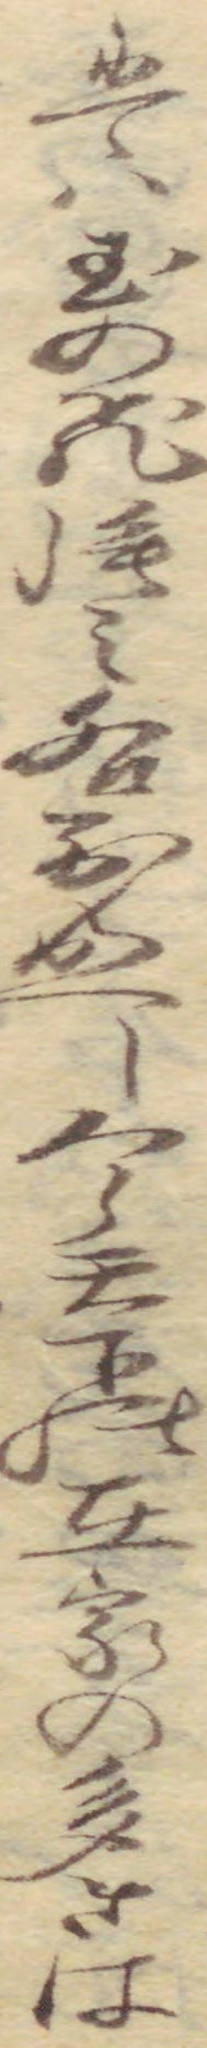にては玉の飛強み格別成へし今天下の在家の多きは
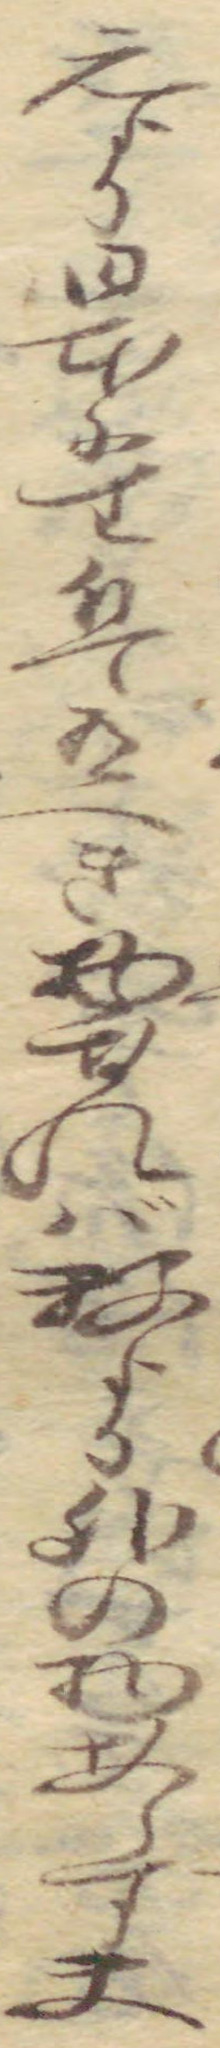元より日本に生付て有へき物なれば数より外の物ならす夫
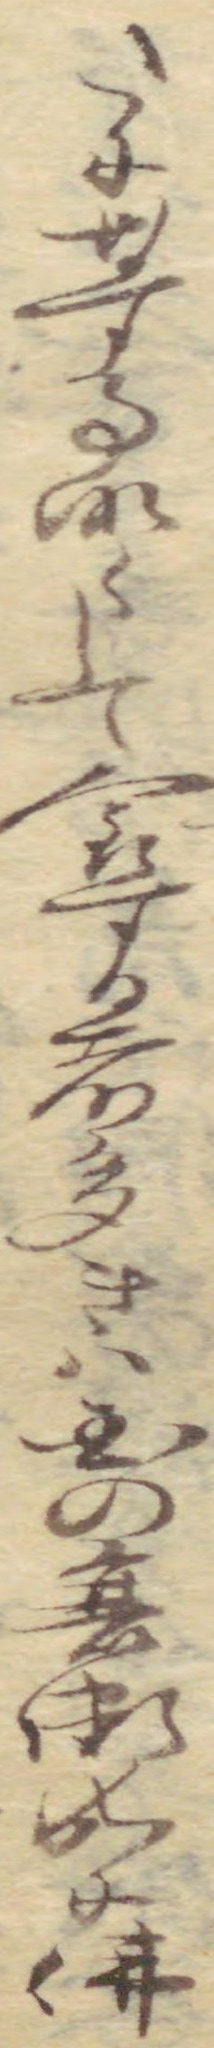たになす事なくして食する物多きは国の衰微成に仏
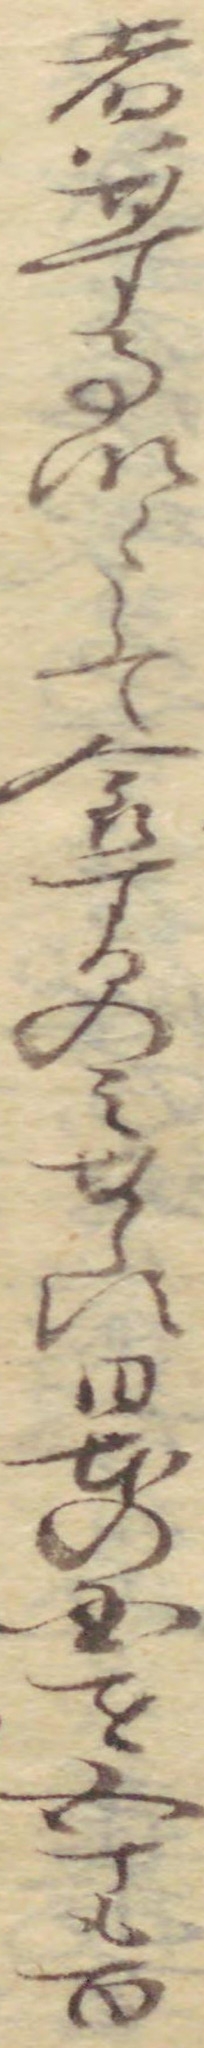者はなす事なくして食するのみならす日本の国を五十も百
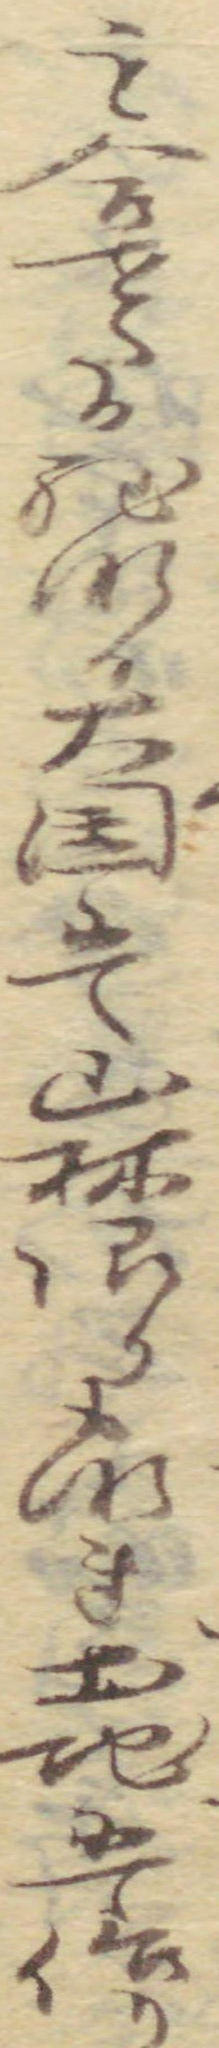も合せたる程なる大国にて山林限りもなき土地にて作り
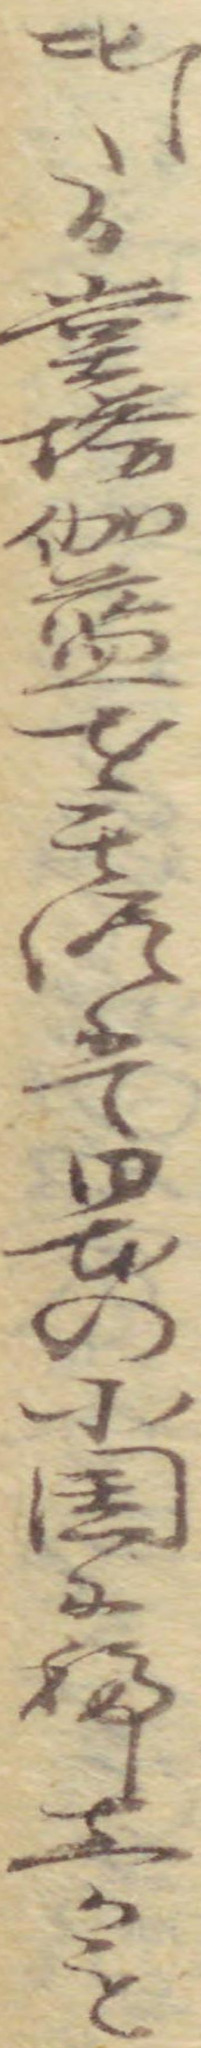出したる堂塔伽藍を其侭にて日本の小国に移ししかも
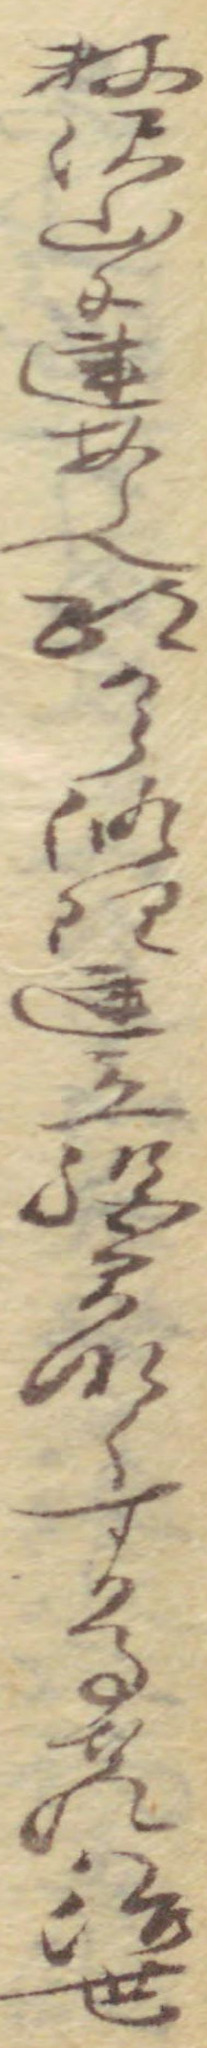数沢山に建ならへ跡から修理建立絶間なくする事なれは治世
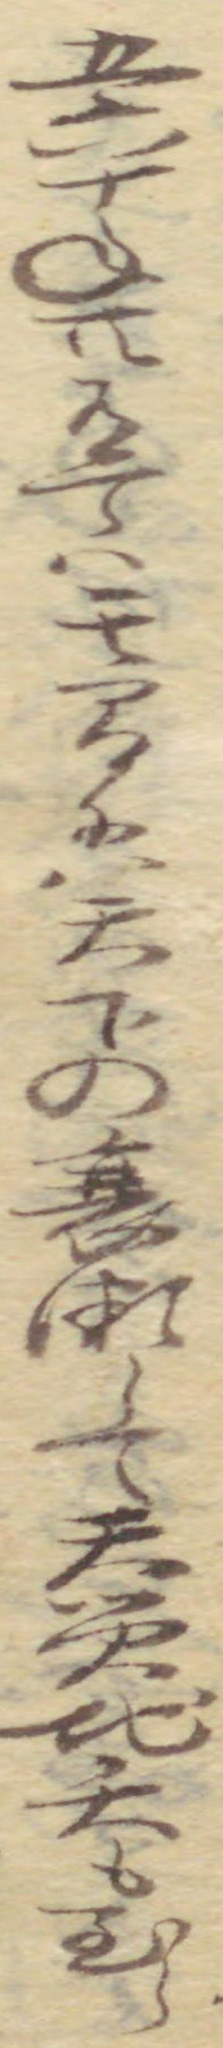五六十年共有ては其間には天下の衰微して天災地夭も至し
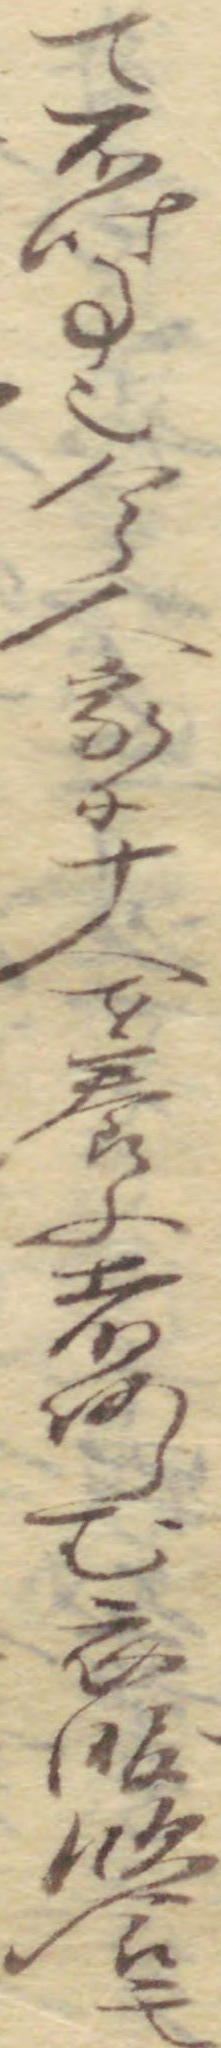て不叶事也今人家に十人を養ふ者あらむ衣服飲食も
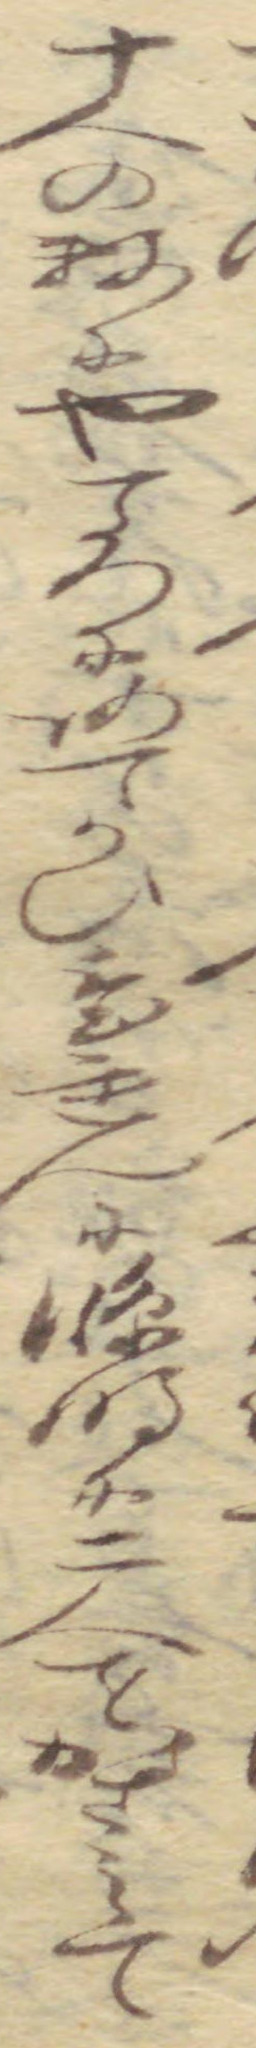十人の数にやころにあてかひ置れんに臨時に二人をかさみて
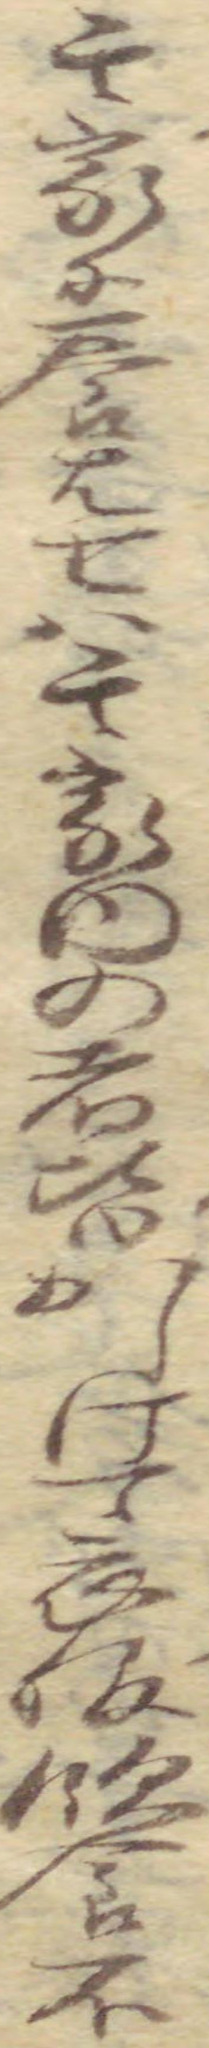其家に養はせは其家内の者皆かしけて衣服飲食不
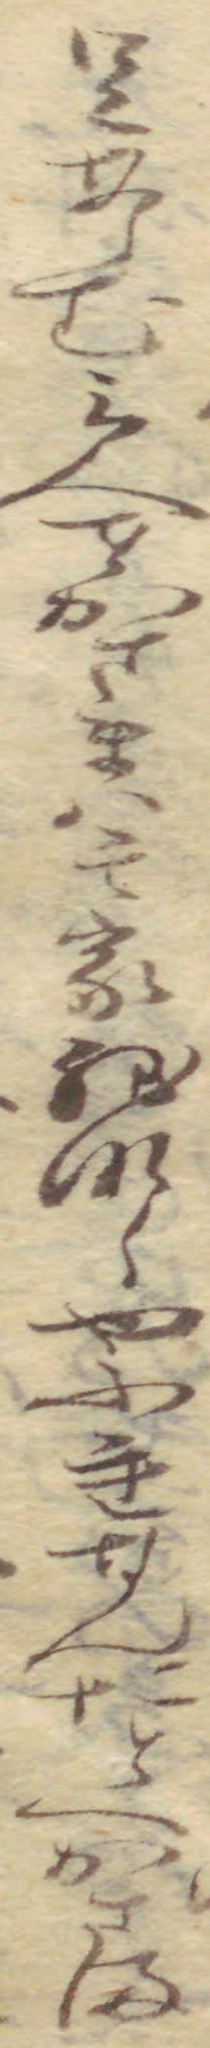足ならむ三人をかさまは其家程なくやふれなんたとへかさま
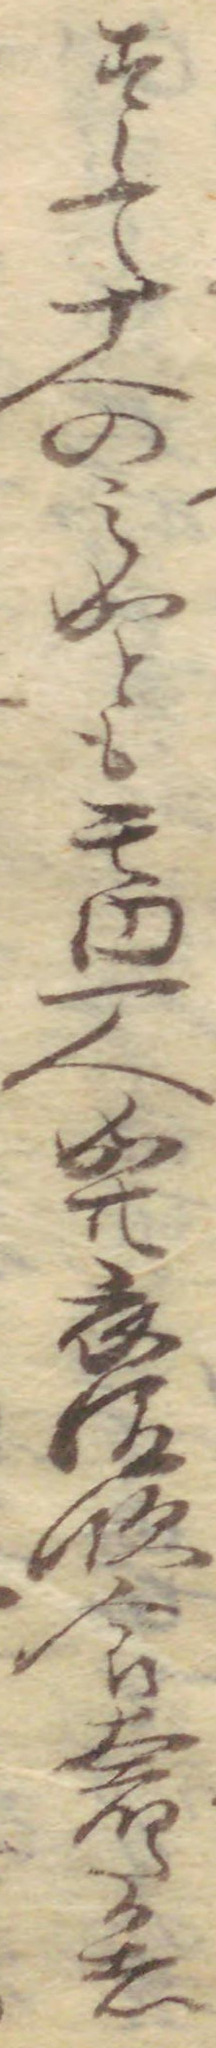すして十人のみ成とも其内一人成共衣服飲食奢たる者
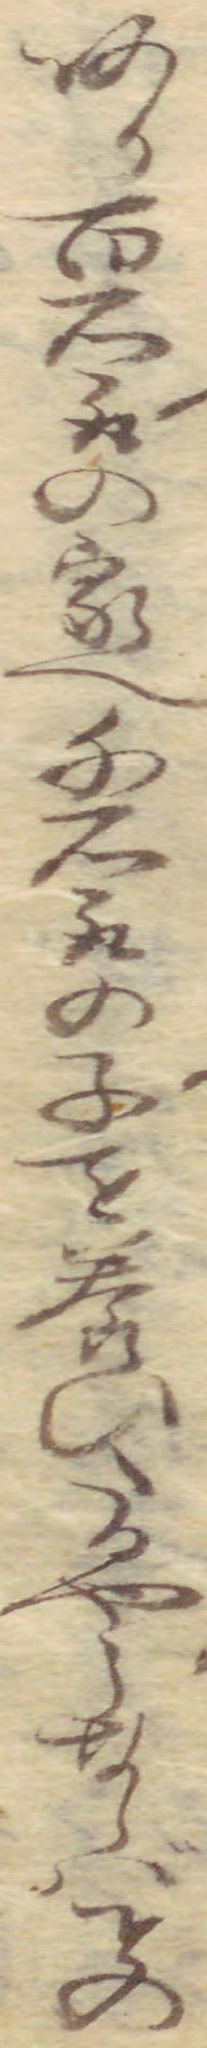あり百石取の家へ千石取の子を養ひたるやうならばその
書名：鶯宿雑記. 巻263-264
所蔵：国立国会図書館 National Diet Library, JAPAN
